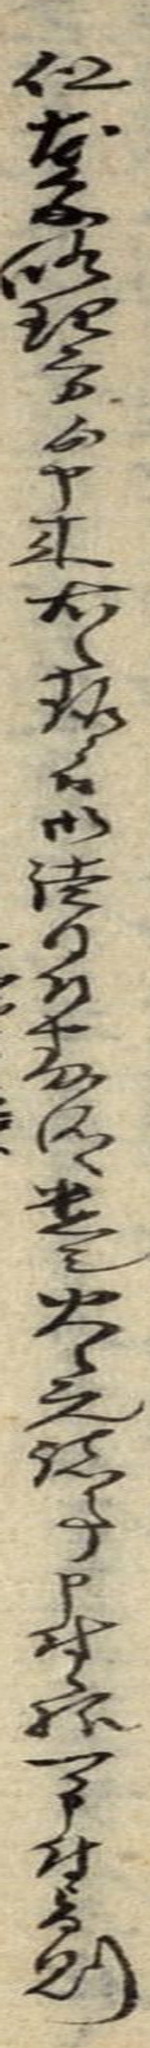但本多修理方ゟ申来右之趣に付御徒目付番所へ遣し火之元諸事申付候様可申付旨則
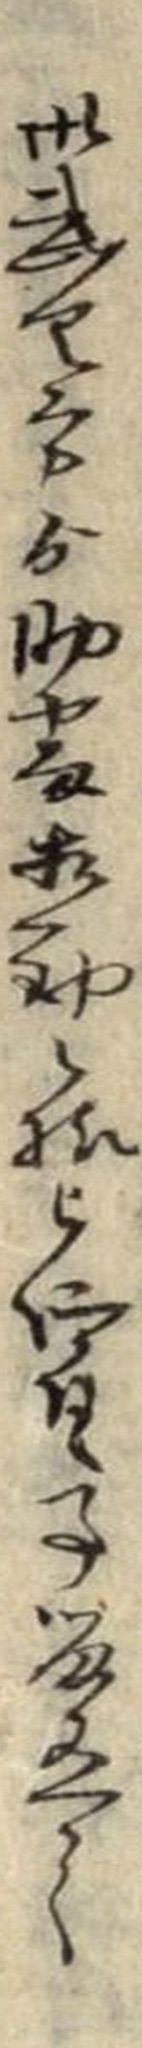御武具方ゟ助番相勤候様被仰付候事留有之
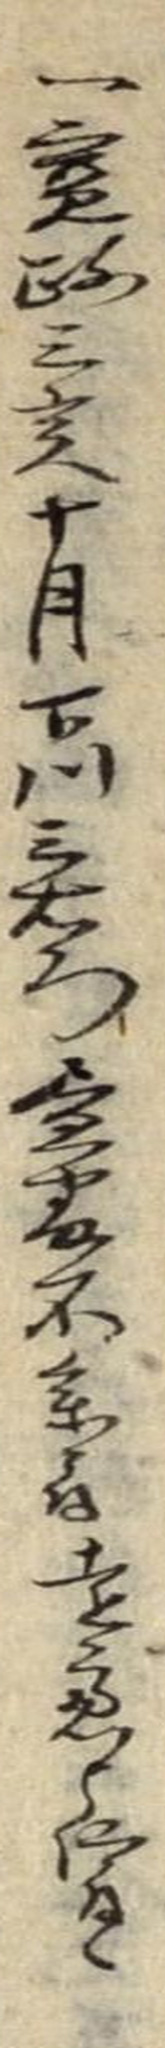一寛政三亥十月下川三右衛門昼番不参に付遠慮被仰付候
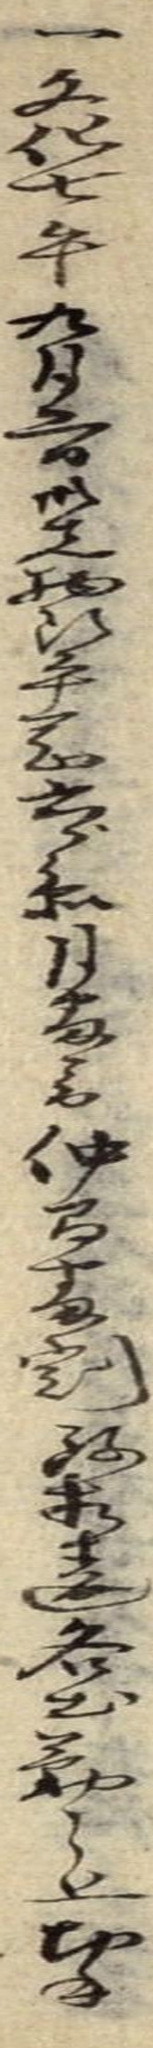一文化七午九月二日御先物頭平岡六郎兵衛月番に而仲間番割致相違各出勤之上切手
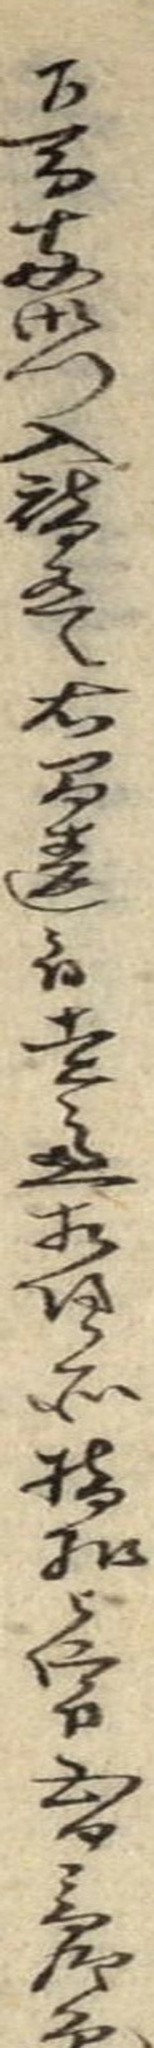下馬両御門入替有之右間違に付遠慮相伺候処指扣被仰付五日に而御免
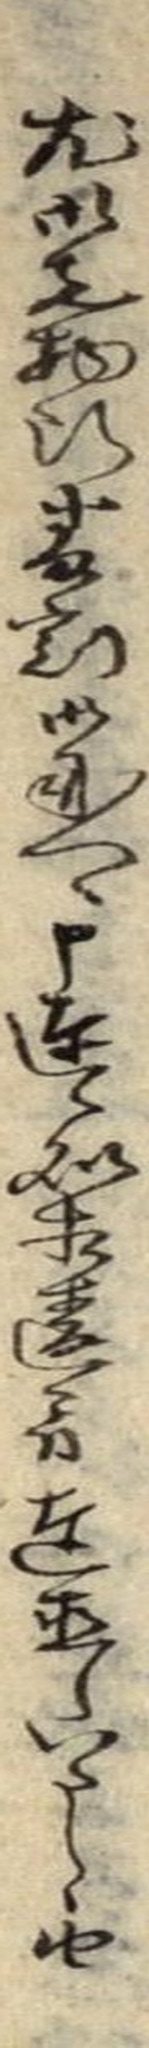尤御先物頭番割御用人へ申達候処相違に付達直しいたし候由
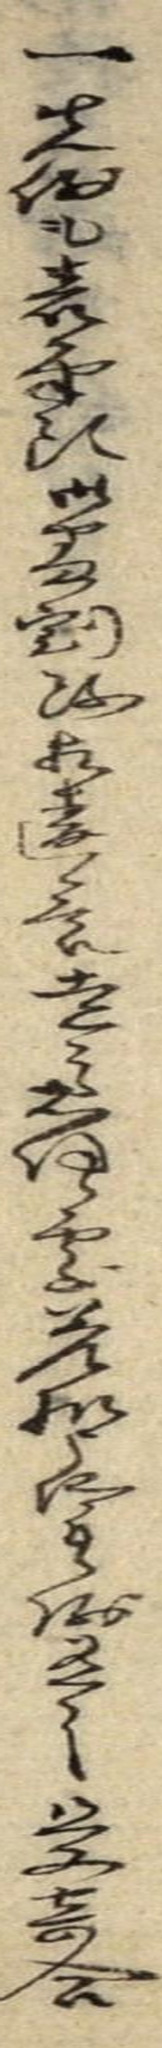一先例も表筆頭御番割致相違候節遠慮伺候処差扣被仰付例有之且又寄合
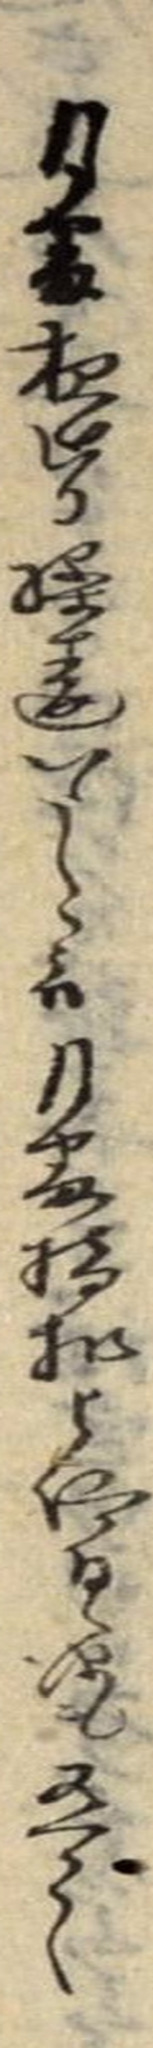月番夜廻り繰違いたし候付月番指扣被仰付儀も有之

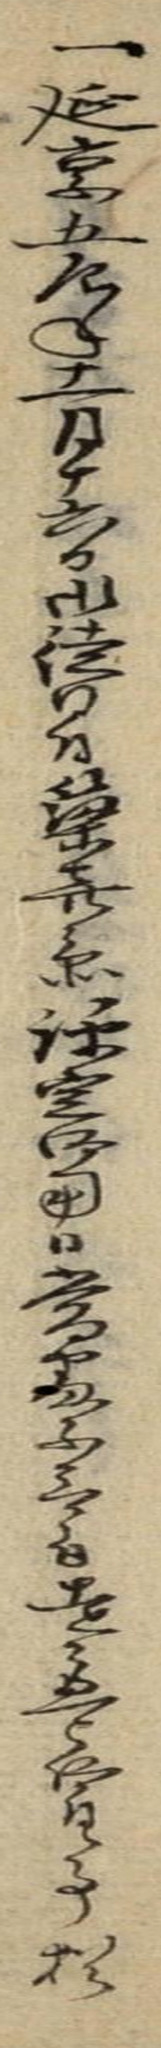一延享五辰年十一月十六日御徒目付簗喜兵衛評定御用日当番不参に付遠慮被仰付候事猶
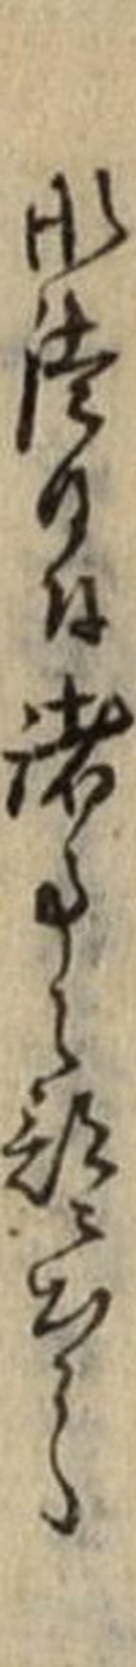御徒目付諸事之部に出之
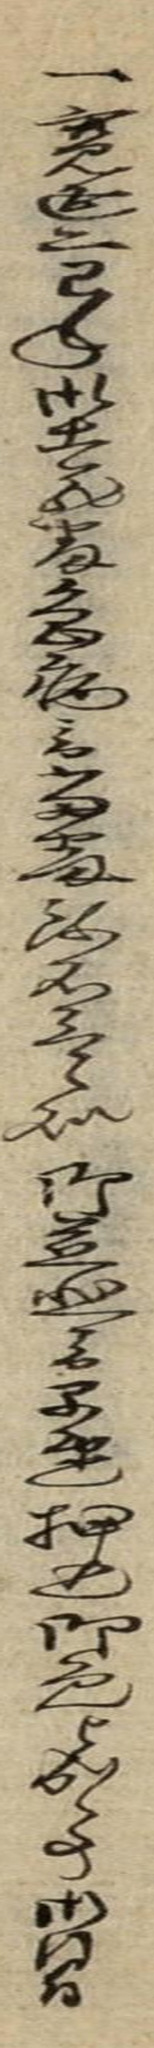一寛延二己年御土蔵番急病に而当番致不参候処御慈悲に而早速押込御免被成候事御目付
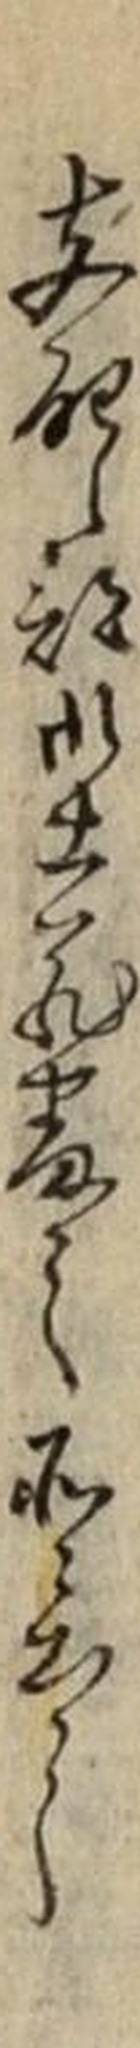支配之部御土蔵番之所に出之
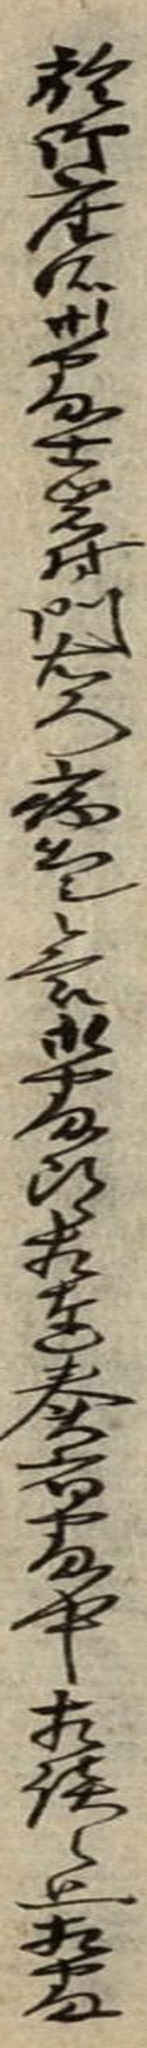一於御座所御番士岩村門右衛門病出し候節御番頭へ相達奏者番中相談之上相番
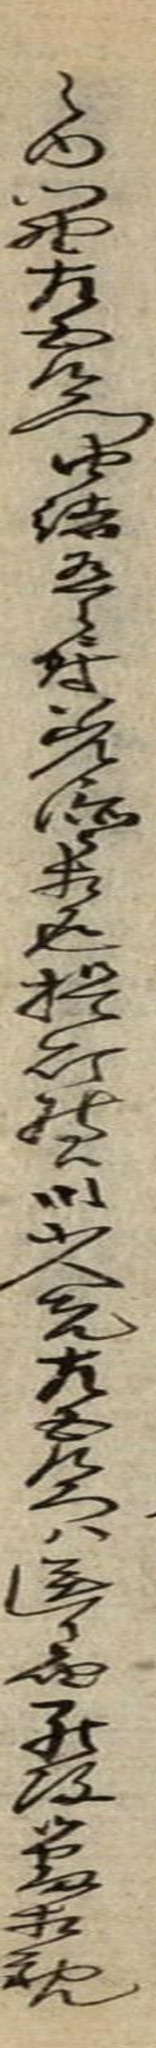之内門野左五左衛門由緒有之に付差添に相返提灯持は御小人出る左五左衛門は送り届罷帰御番相勤る
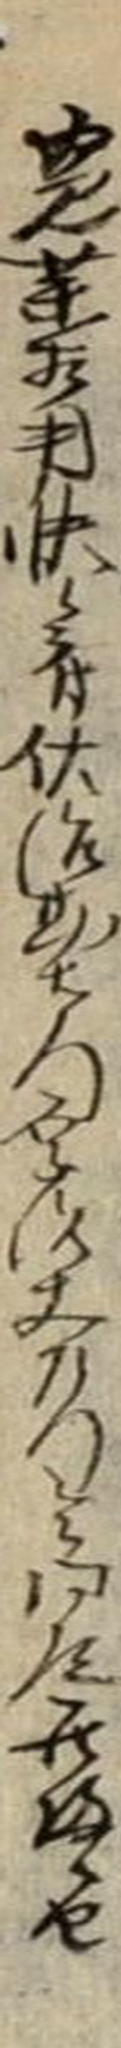為見薬相用快候に付佐治勘右衛門厚治丈左衛門方同道罷帰候由
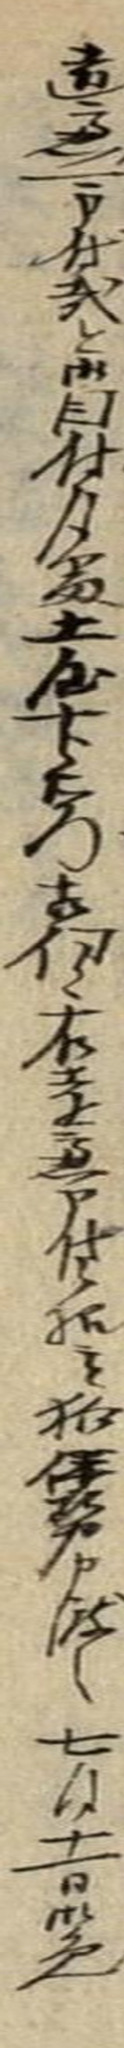遠慮可申付哉と御目付月番土屋十郎右衛門相伺候右遠慮申付候様にと狛伊勢申渡之七月十一日御免
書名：蒐輯之部
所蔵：福井県文書館 Fukui Prefectural Archives
